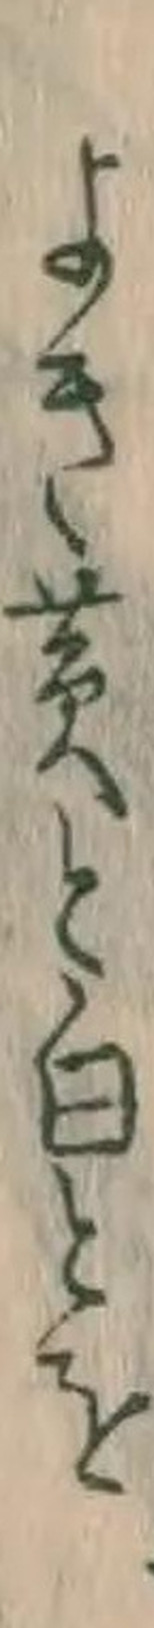よき黄と白とを
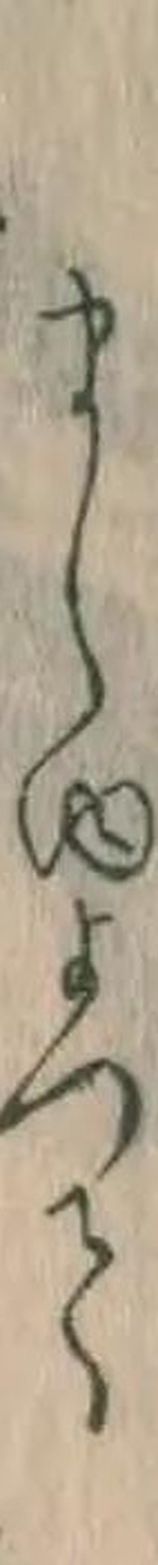ましゆよつて
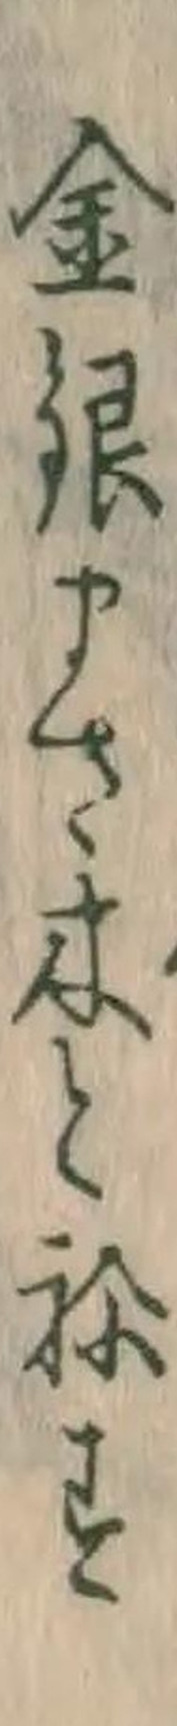金銀まさ木と称す
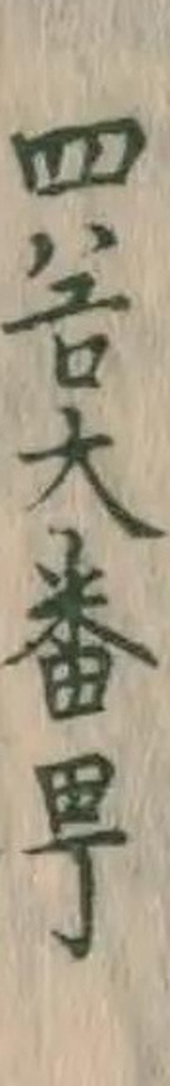四谷大番町
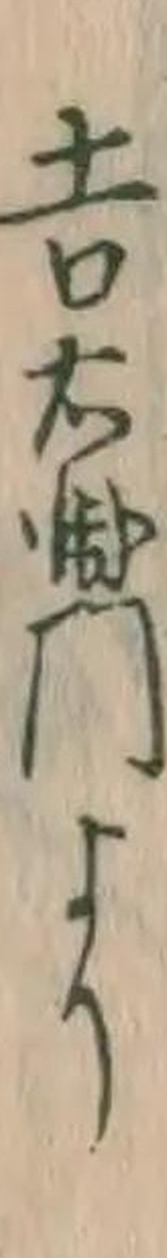吉右衛門より
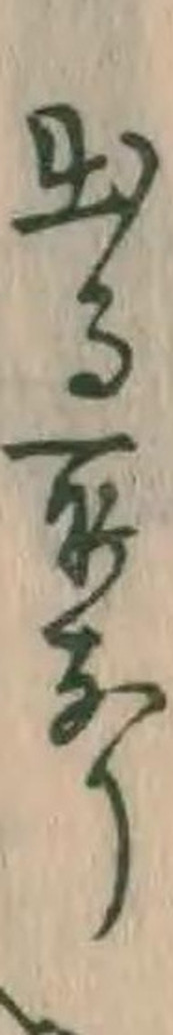出る所なり
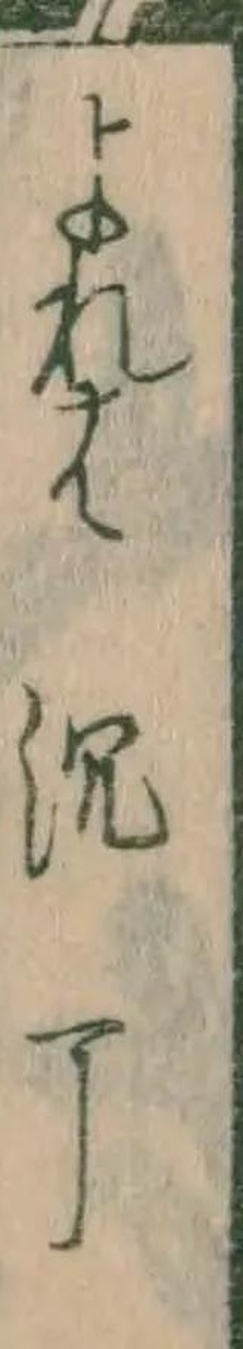よれは沈丁
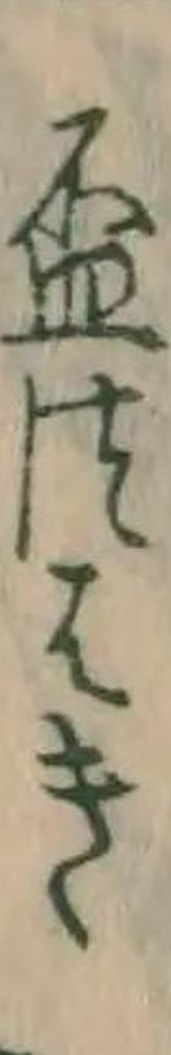盃つはき
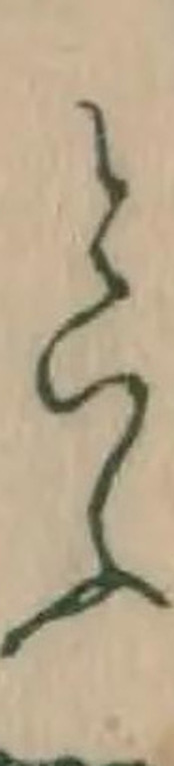といふ
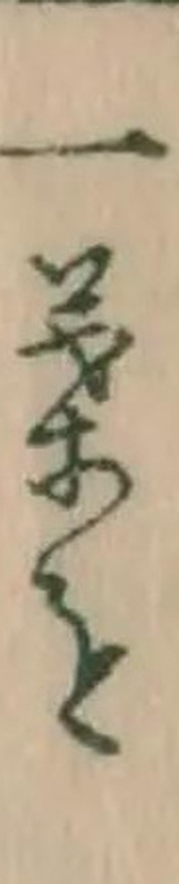一葉を
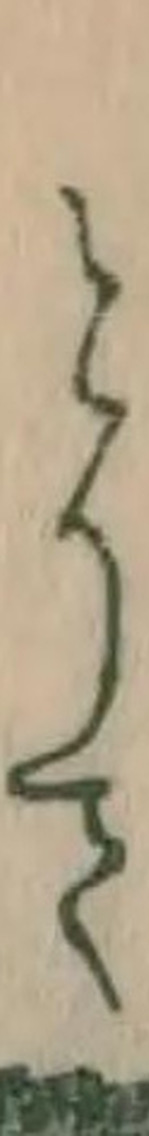とりて
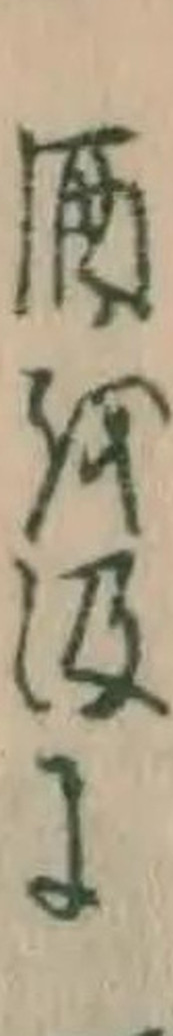酒を汲に
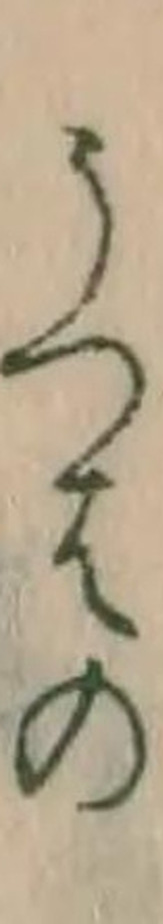うつはの
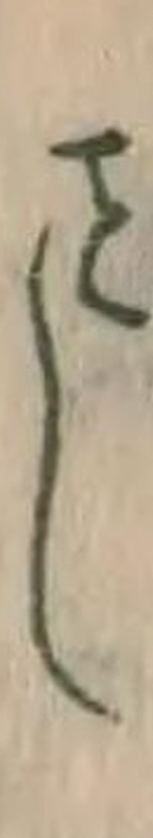ことし
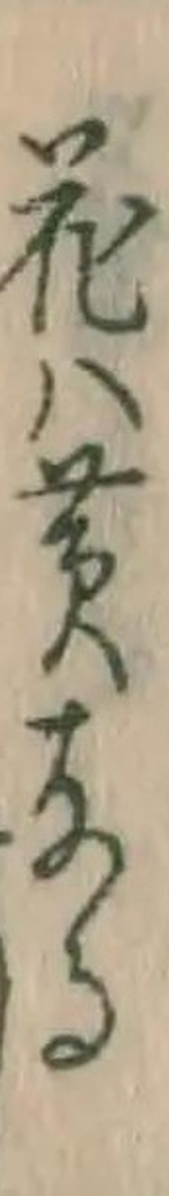花は黄なる
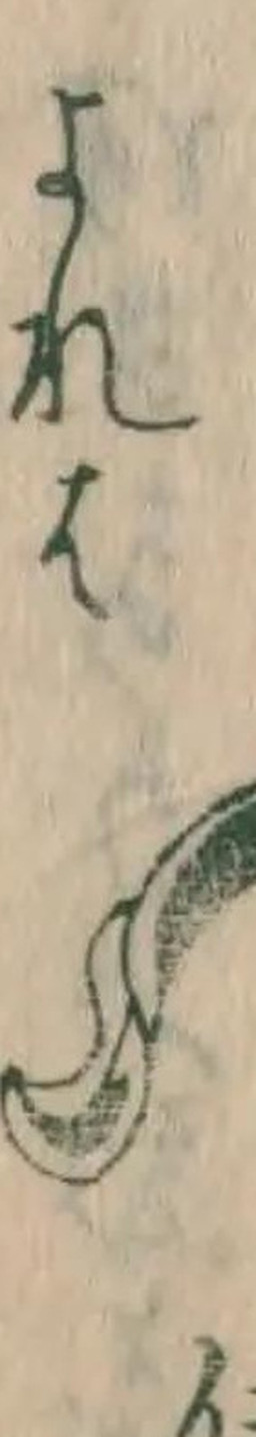よれは
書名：草木奇品家雅見 3巻. [3]
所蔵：国立国会図書館 National Diet Library, JAPAN
